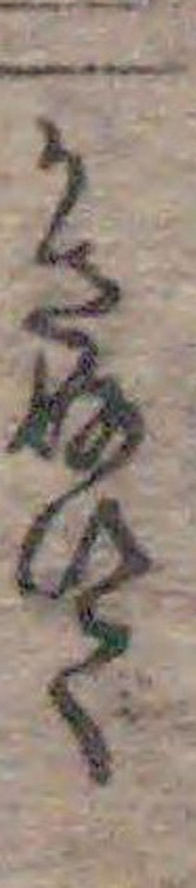かさぬひで
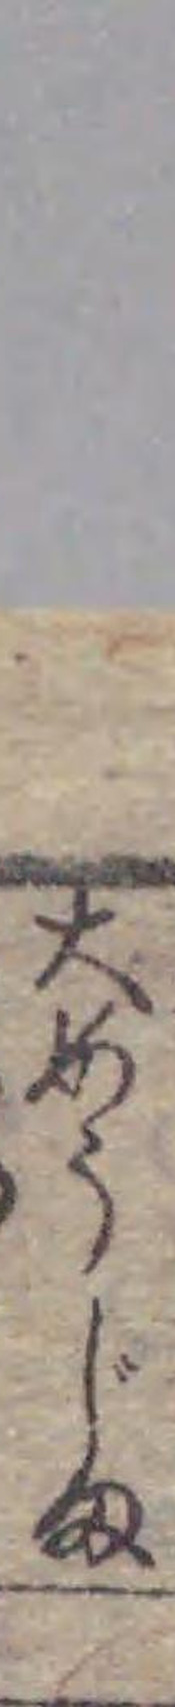大めうしま
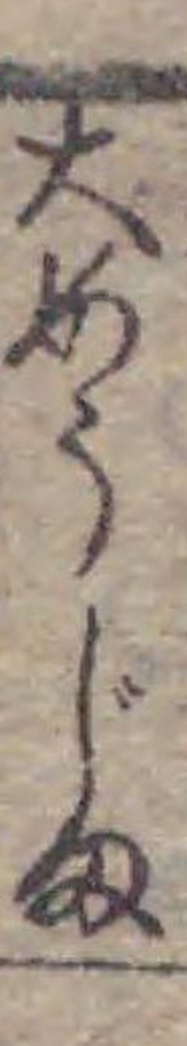大めうしま
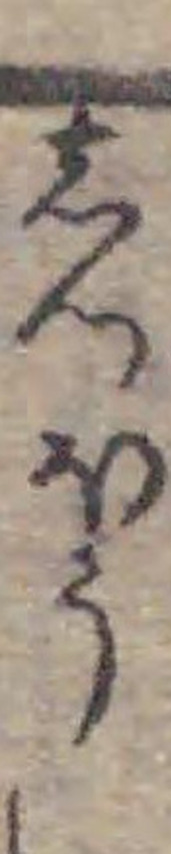しつほう
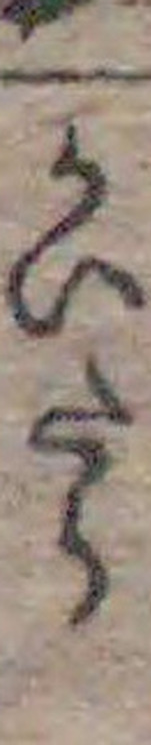かいたら
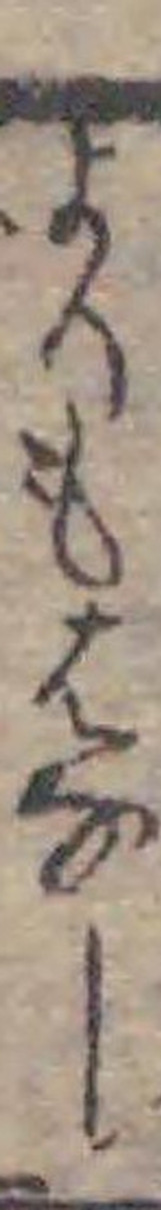よりもはな
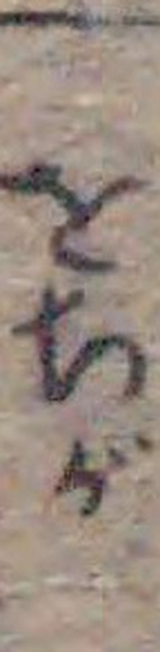をちが
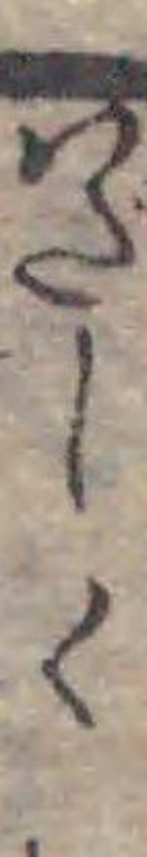はだしく
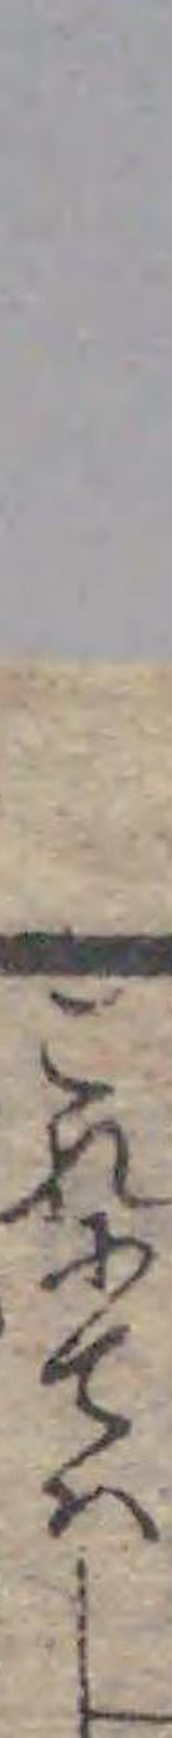これにては
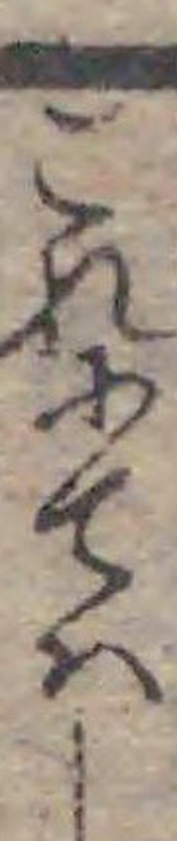これにては
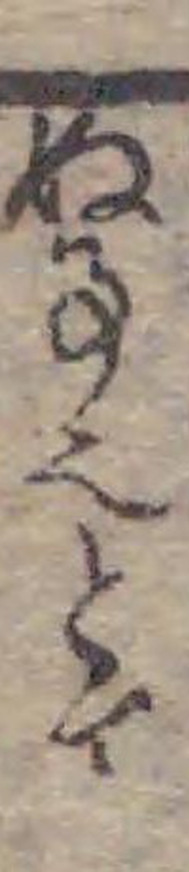ぬ事也とて
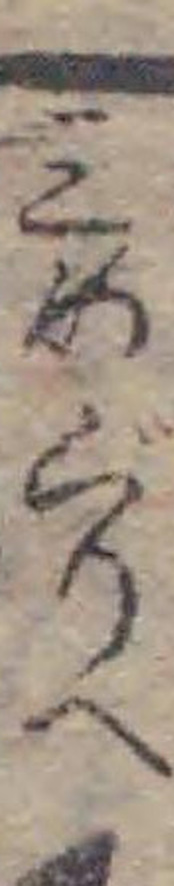三めぐりへ
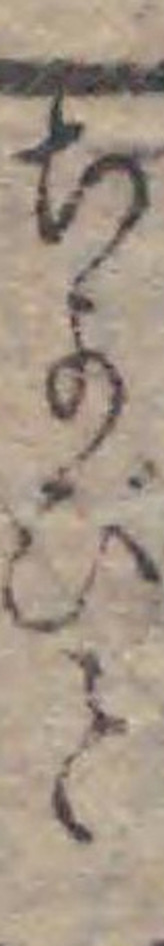ちよびと
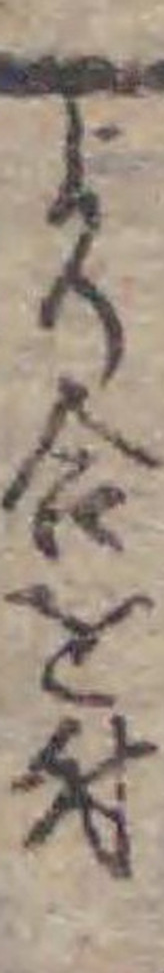より合を付
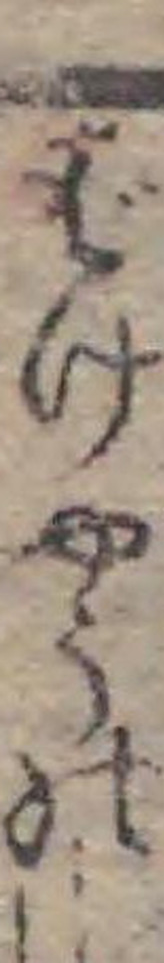はけやうの
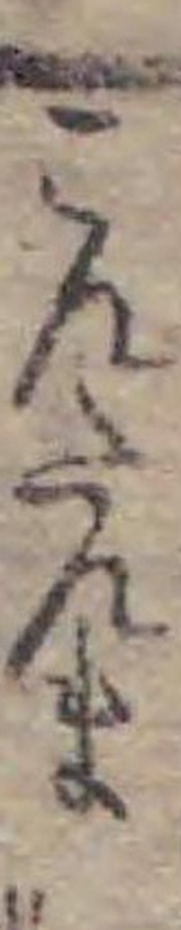こんたんま
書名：紺屋百物語 : 3巻
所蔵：国立国会図書館 National Diet Library, JAPAN
